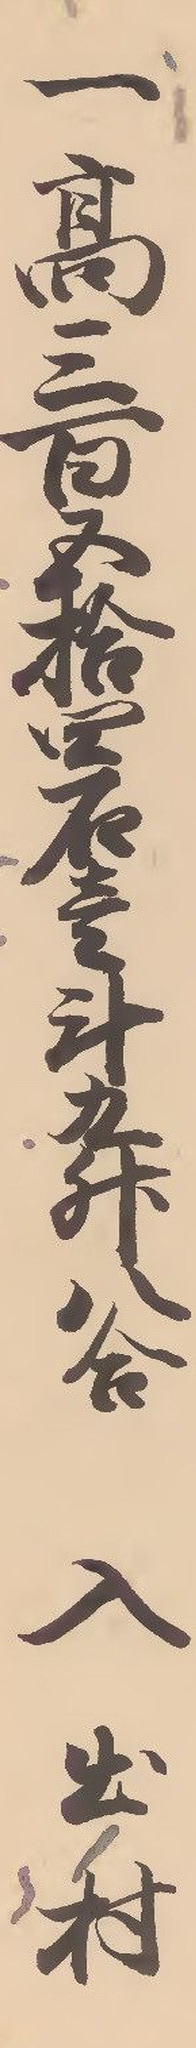一高三百五拾四石壱斗九升八合入出村

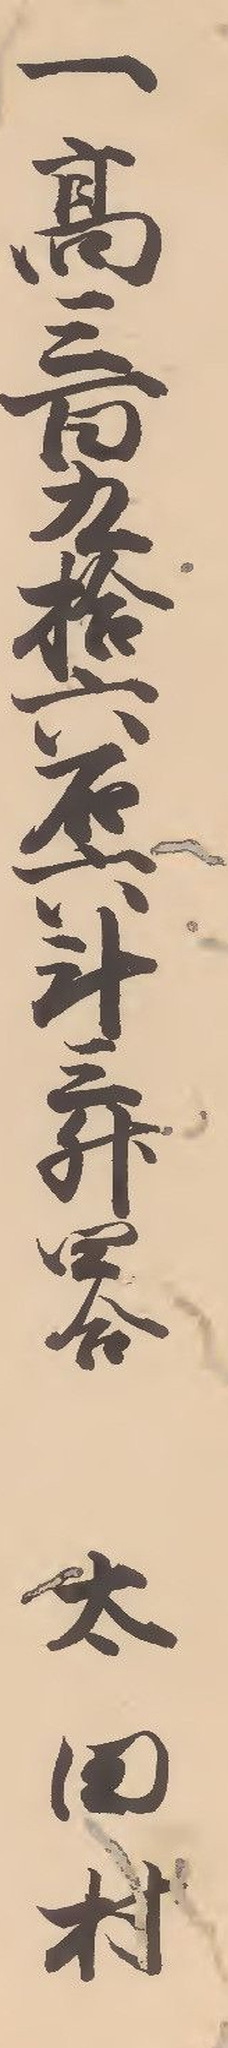一高三百九拾六石六斗三升四合太田村
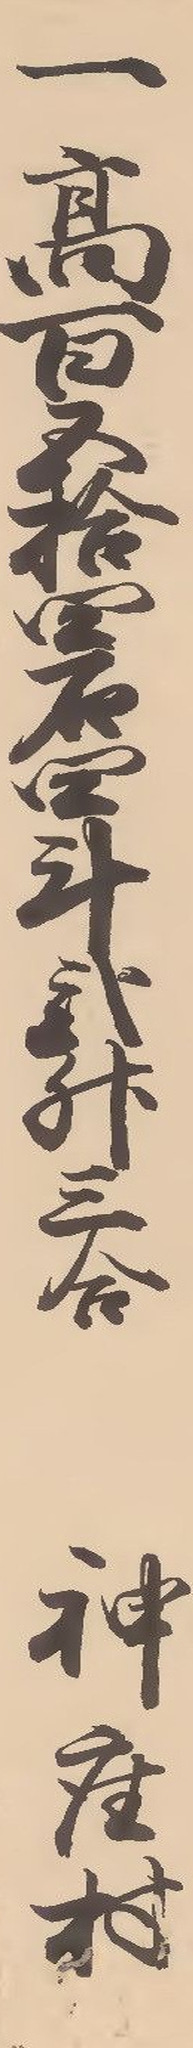一高百五拾四石四斗弐升三合神座村
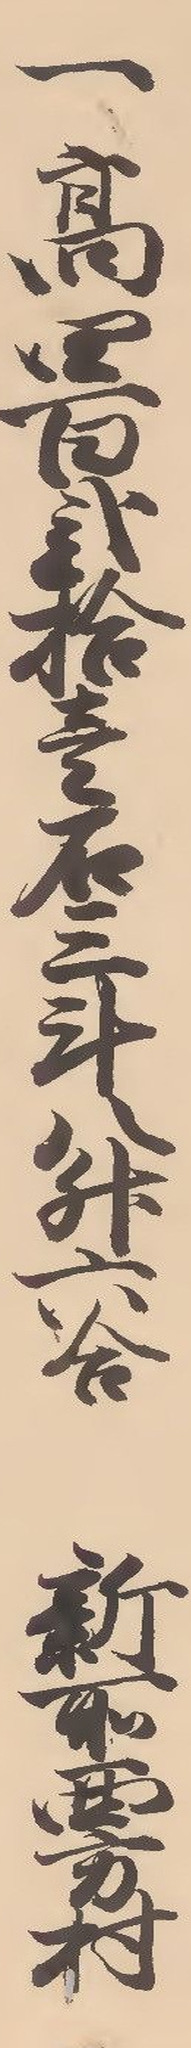一高四百弐拾壱石三斗八升六合新所西方村
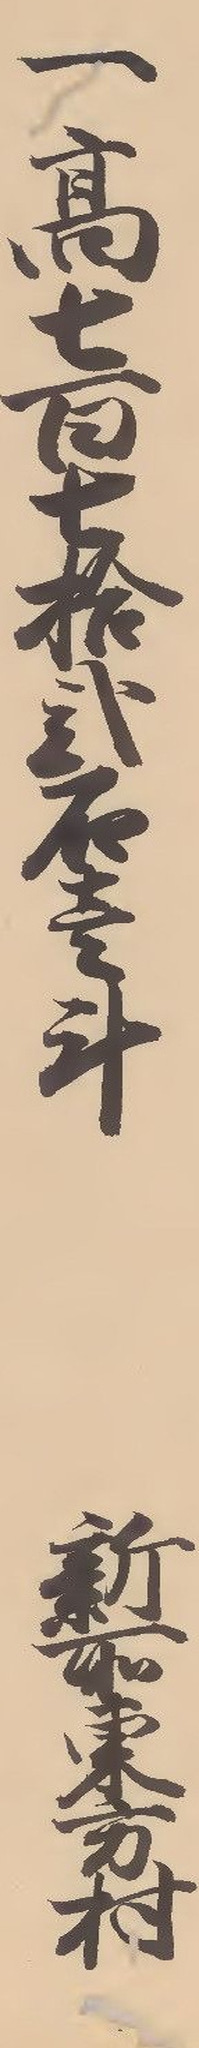一高七百七拾弐石壱斗新所東方村
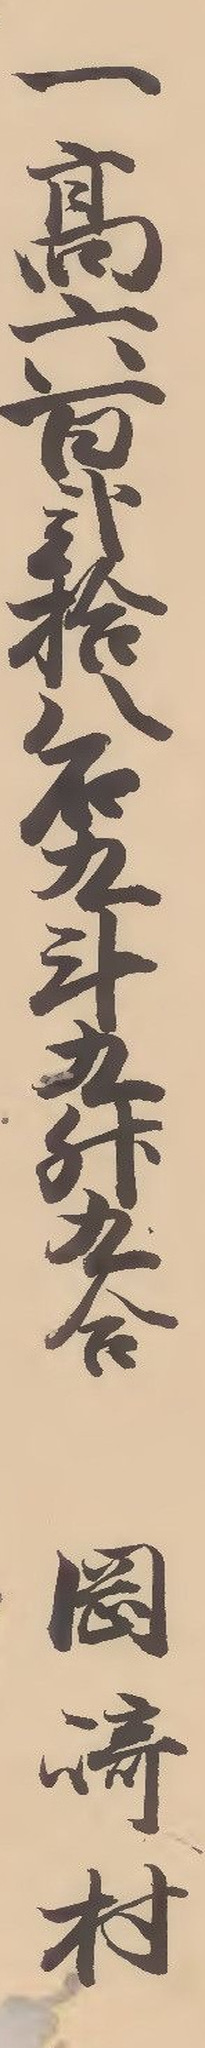一高六百弐拾八石九斗九升九合岡崎村
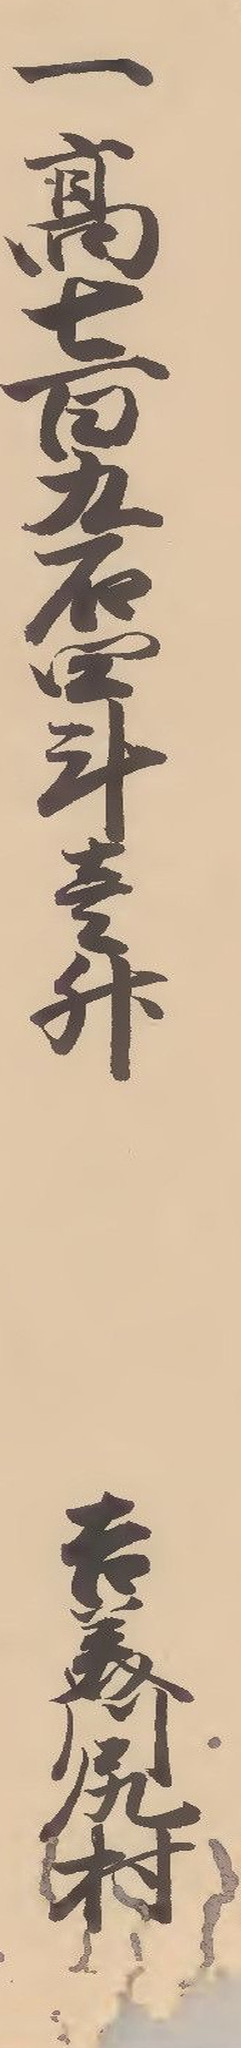一高七百九石四斗壱升吉美川尻村
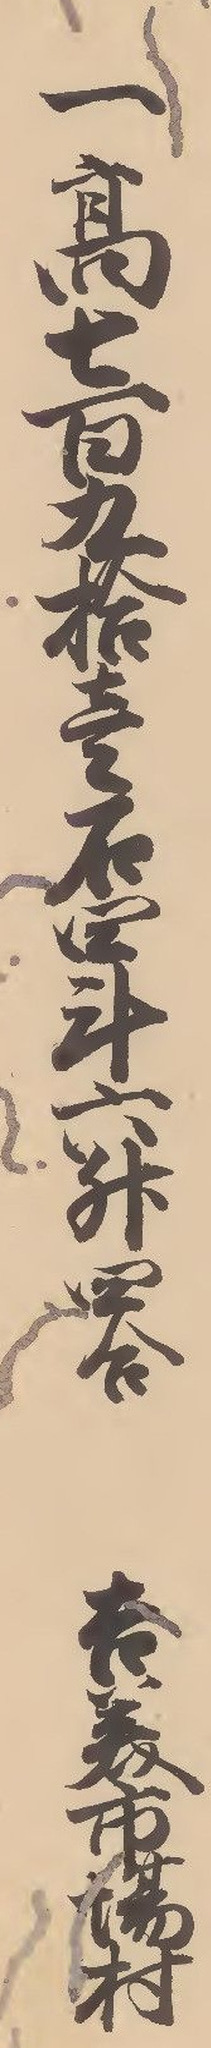一高七百九拾壱石四斗六升四合吉美市場村

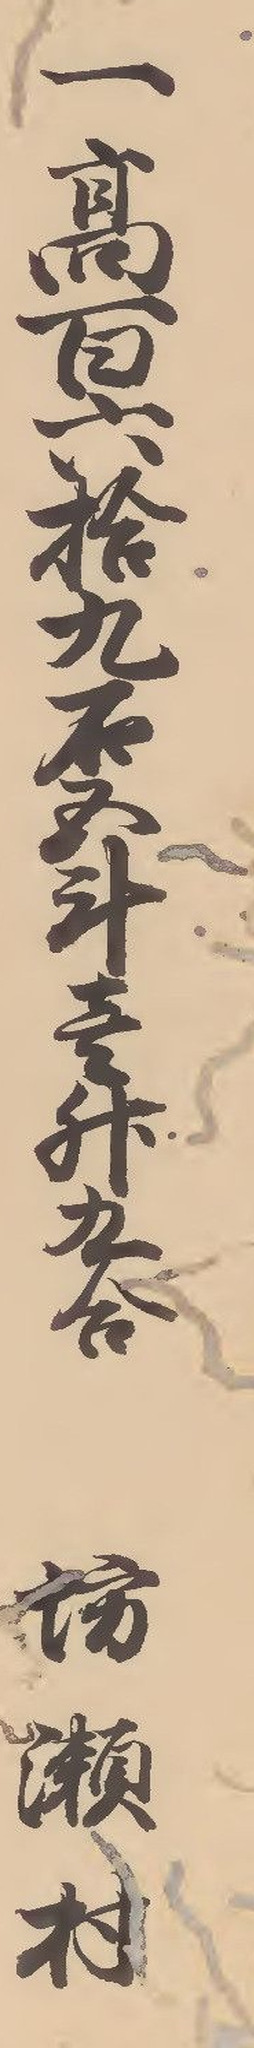一高百六拾九石五斗壱升九合坊瀬村
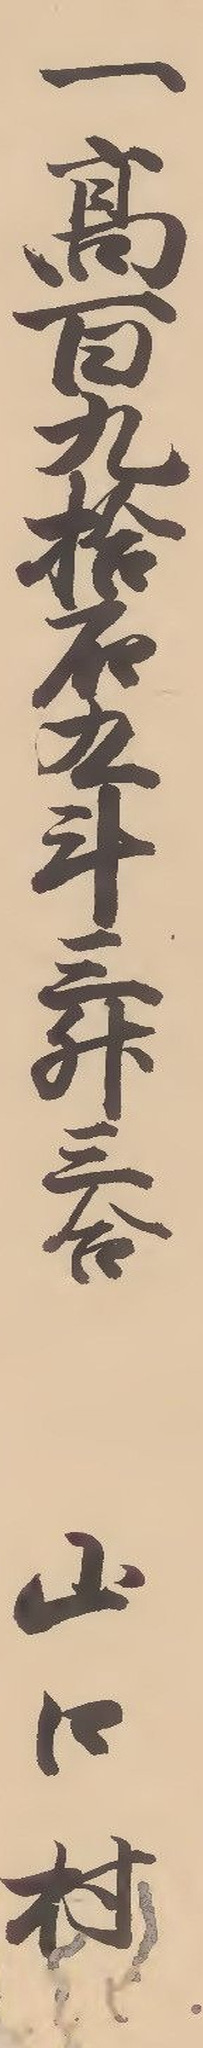一高百九拾石九斗三升三合山口村
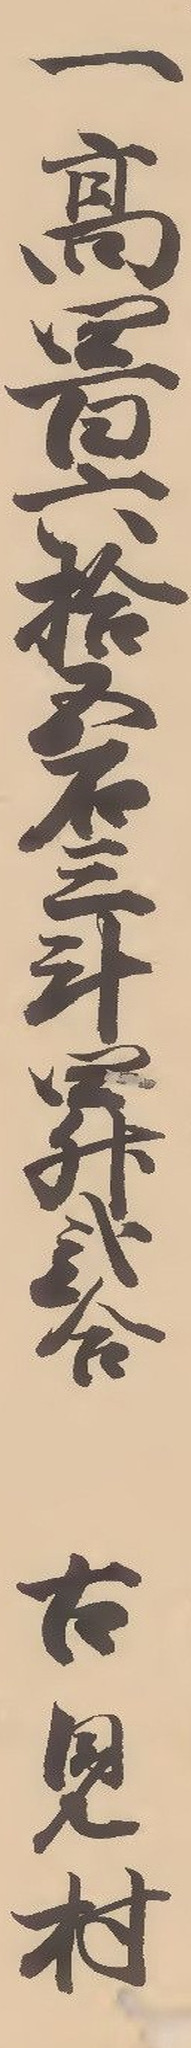一高四百六拾五石三斗四升弐合古見村
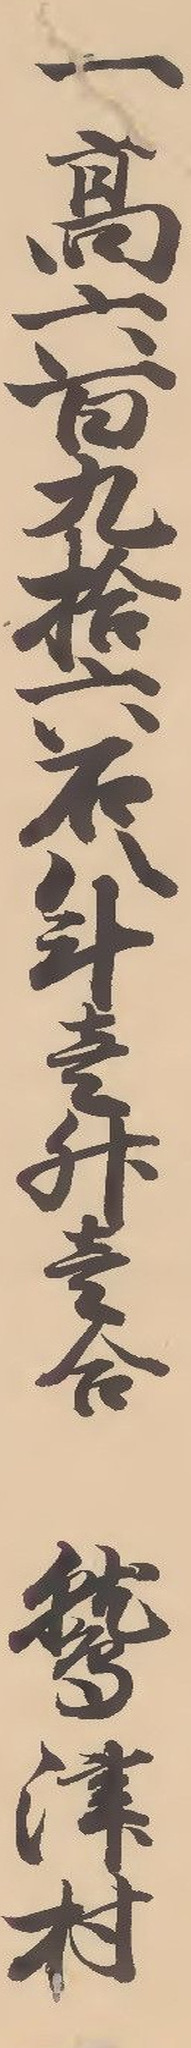一高六百九拾六石八斗壱升壱合鷲津村
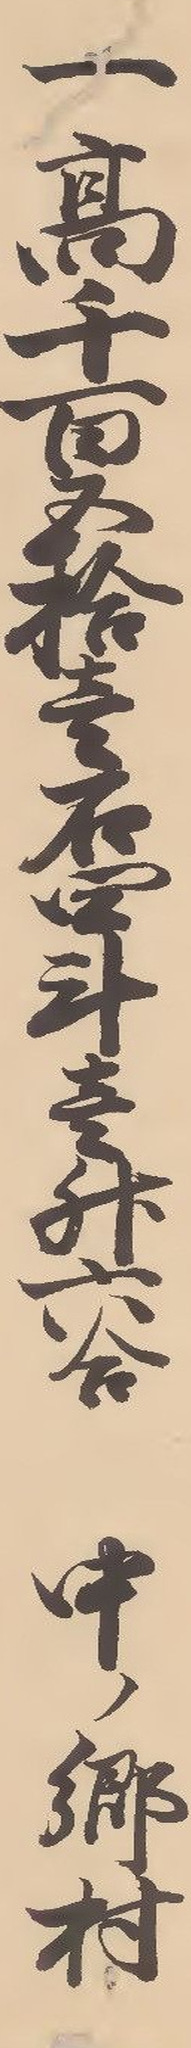一高千百五拾壱石四斗壱升六合中ノ郷村
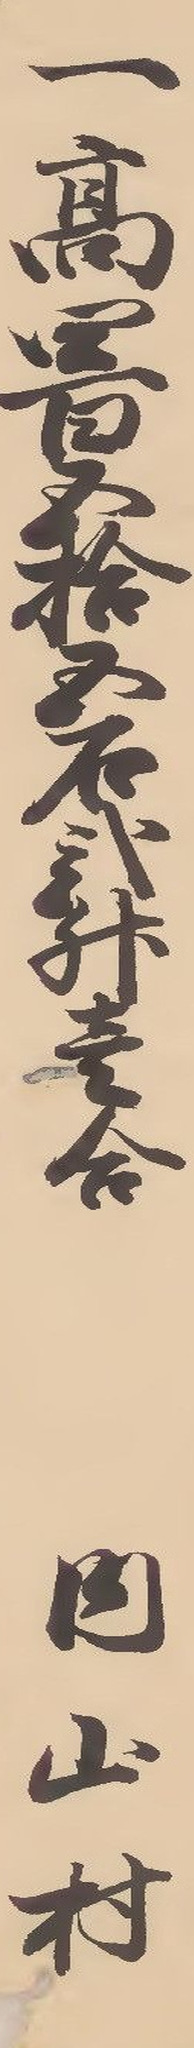一高四百五拾五石弐升壱合内山村
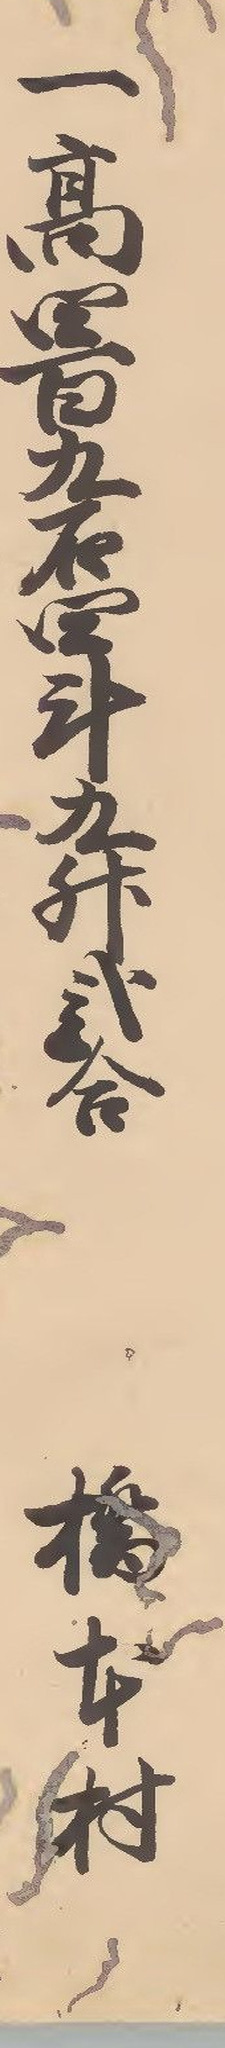一高四百九石四斗九升弐合橋本村

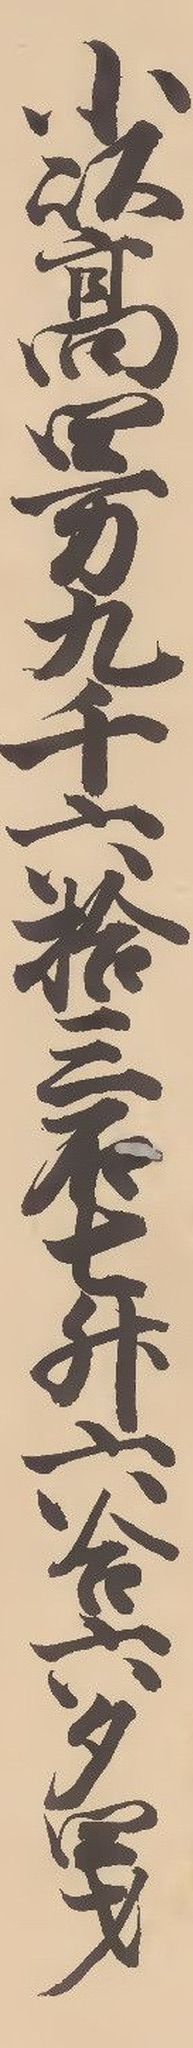小以高四万九千六拾三石七升六合六勺四才
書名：遠江国郷帳
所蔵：国立公文書館 National Archives of Japan
